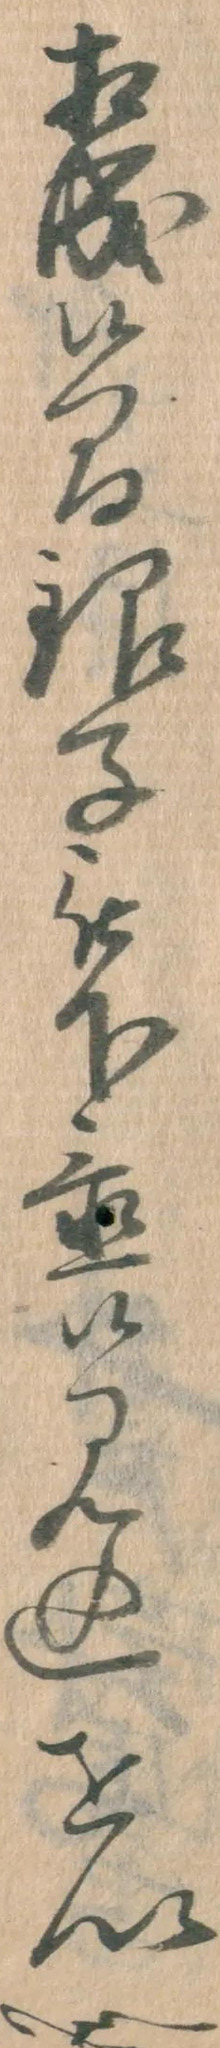相成候間銀子被下置候見込を以
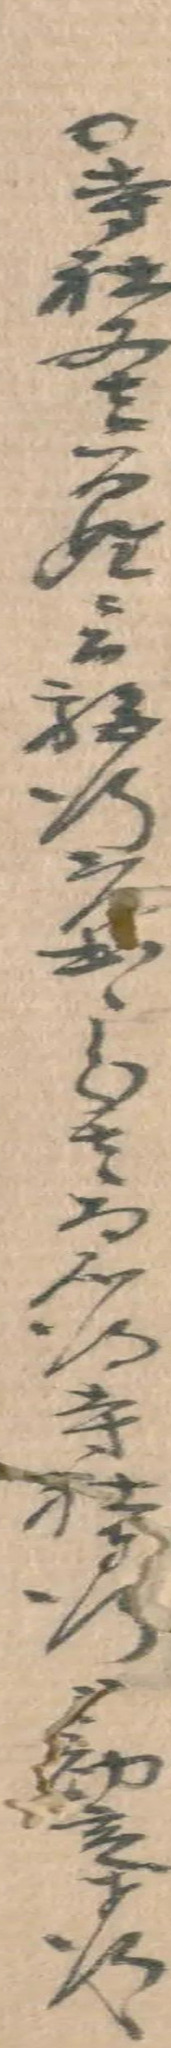◯寺社又は近在百姓ニ而施行差出候分は為心得寺社奉行御勘定奉行へ

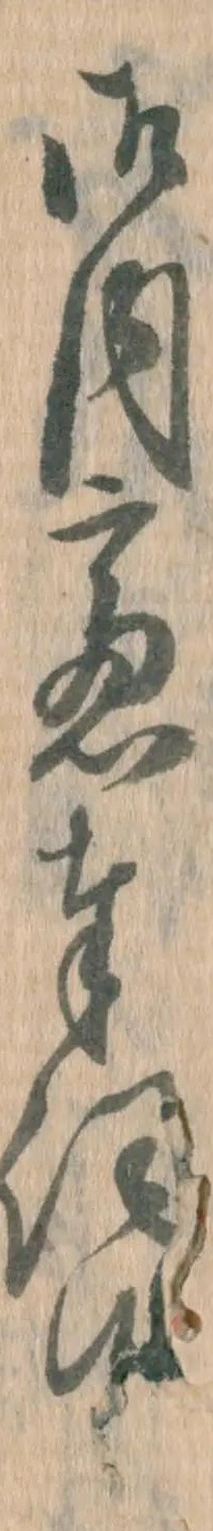御内慮奉伺候
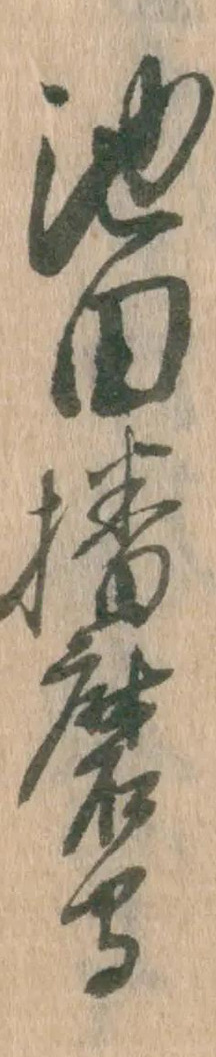池田播磨守
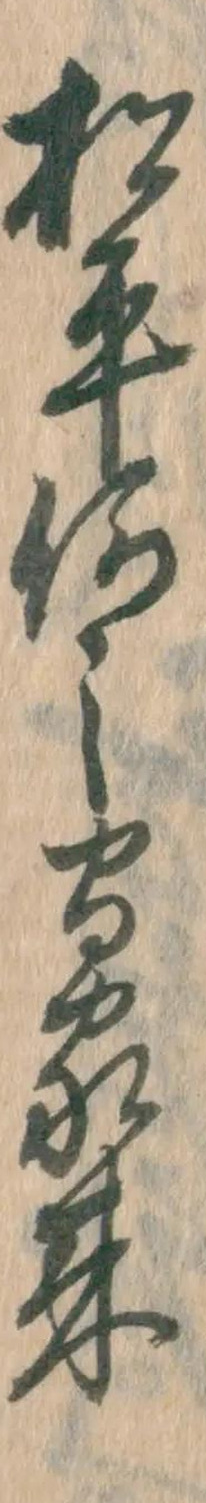松平何之守家来
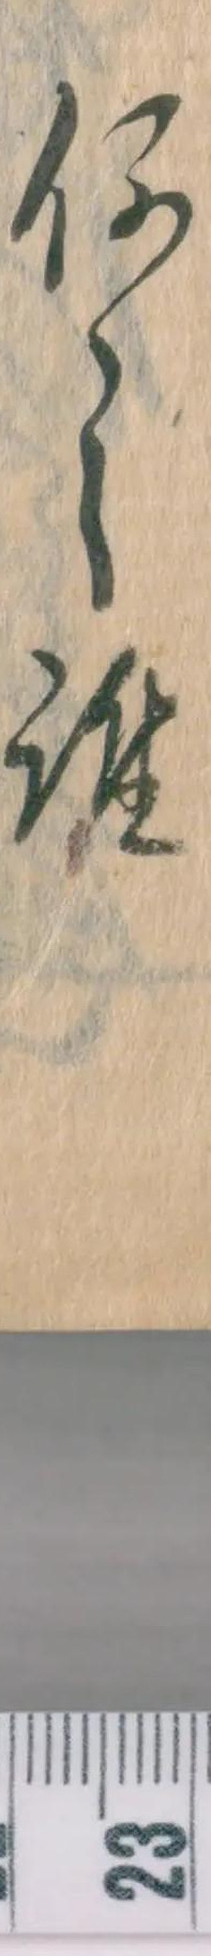何之誰
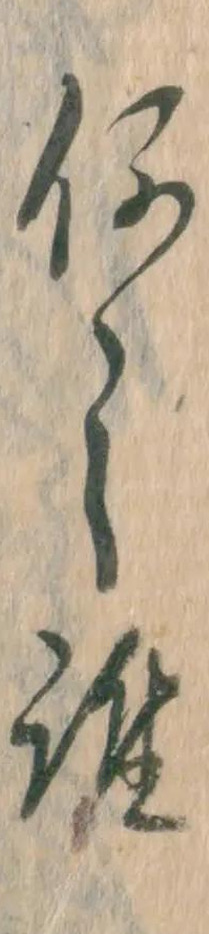何之誰
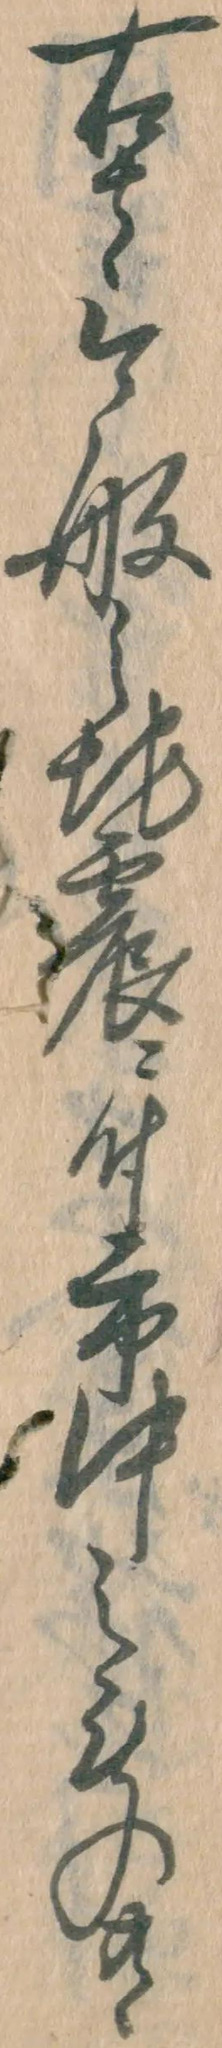右は今般之地震ニ付市中之もの共

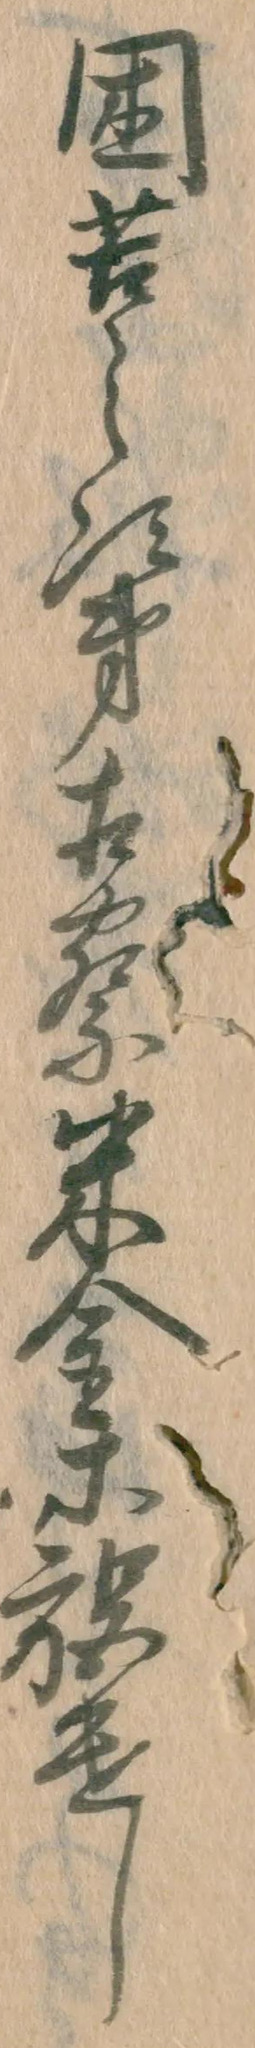困苦之次第相察米金等施遣し
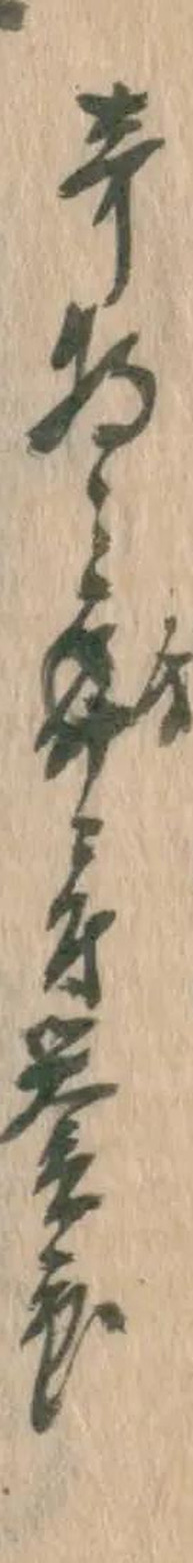奇特之儀ニ付誉置
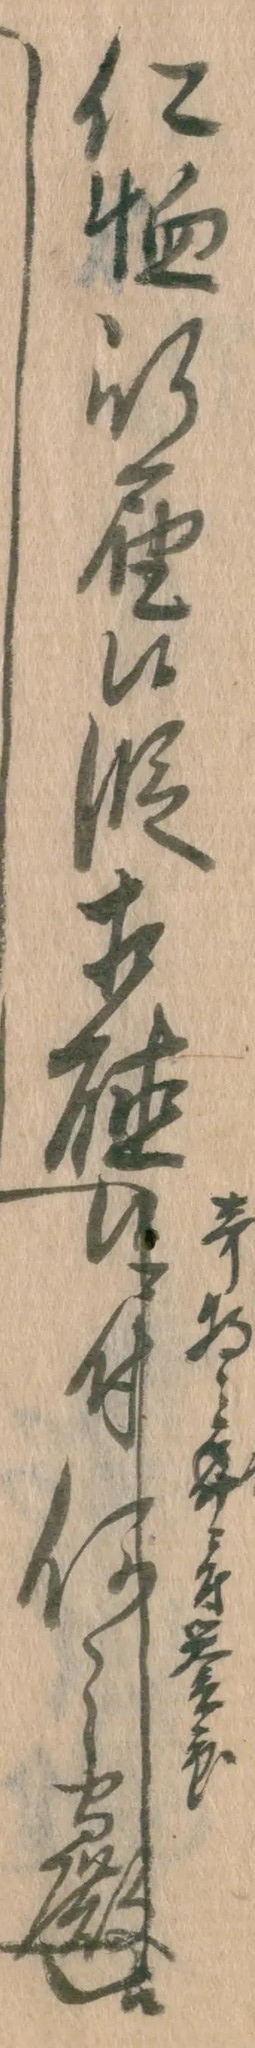仁恤行届候段相聴「候ニ付何之守殿え
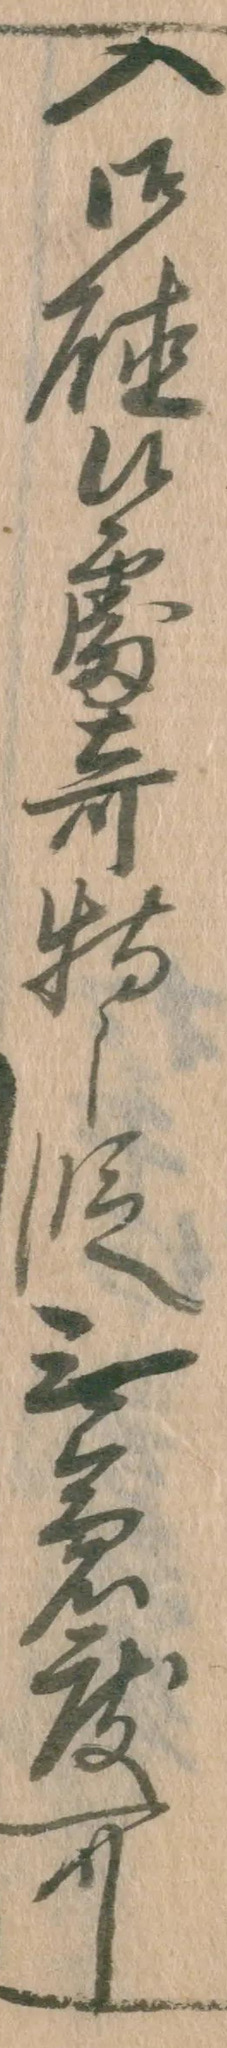入御聴候処奇特之段無急度可
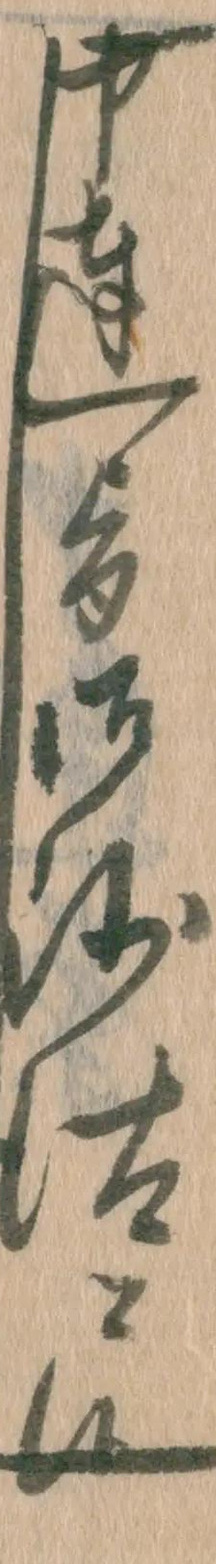申達旨御沙汰ニ候」
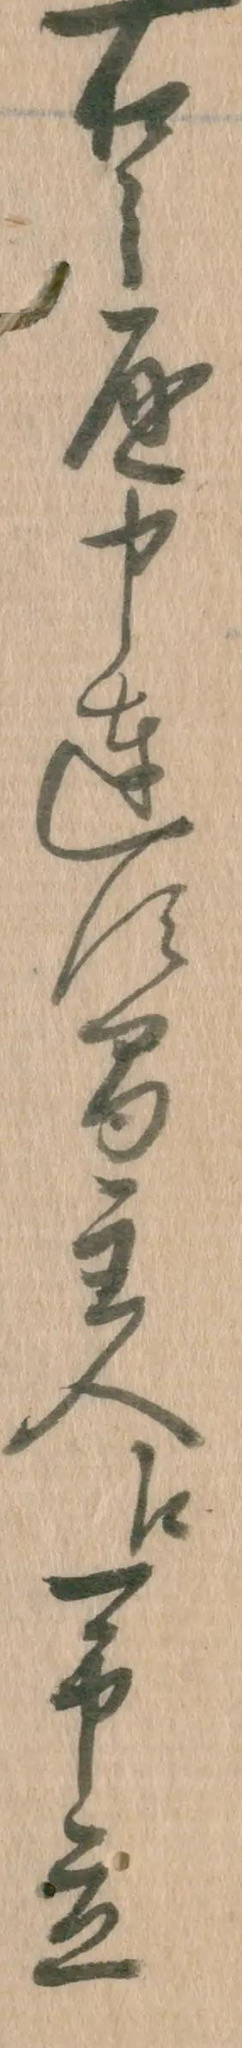右之通申達す間主人え可申立
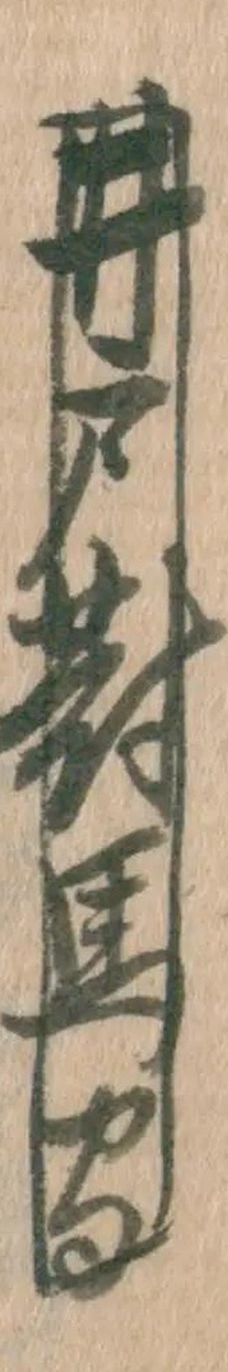「井戸対馬守」
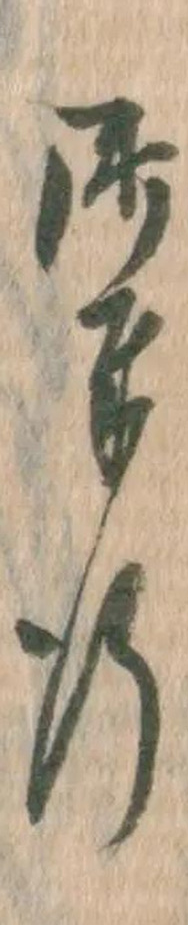御奉行
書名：武家方并寺院等ニテ施差出候一件
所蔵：国立国会図書館 National Diet Library, JAPAN
